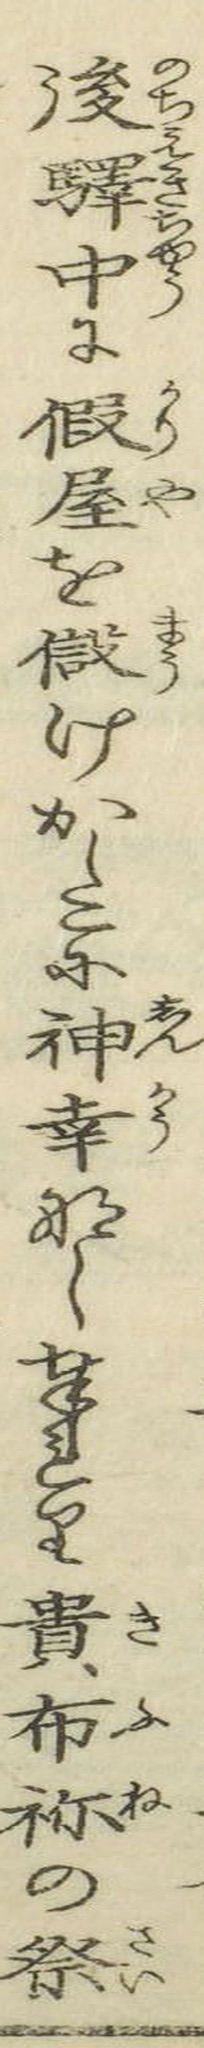後驛中に假屋を儲けかしこに神幸なし奉れり貴布祢の祭
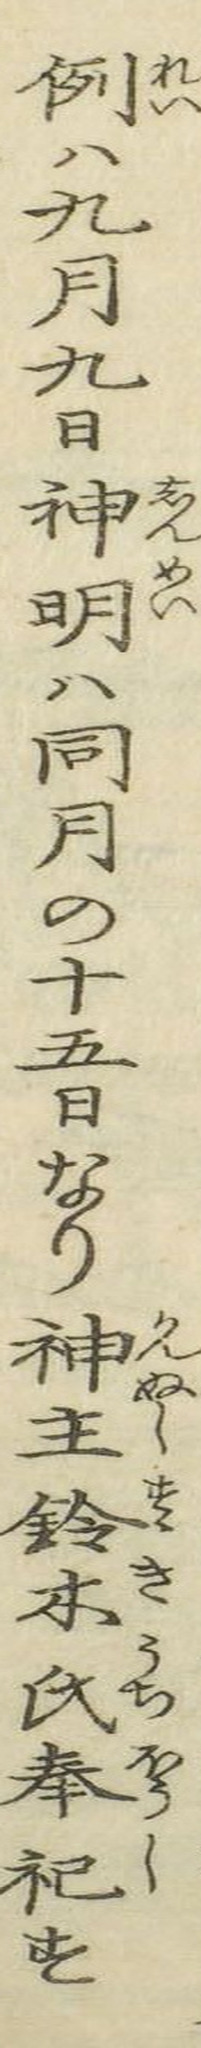例は九月九日神明は同月の十五日なり神主鈴木氏奉祀す
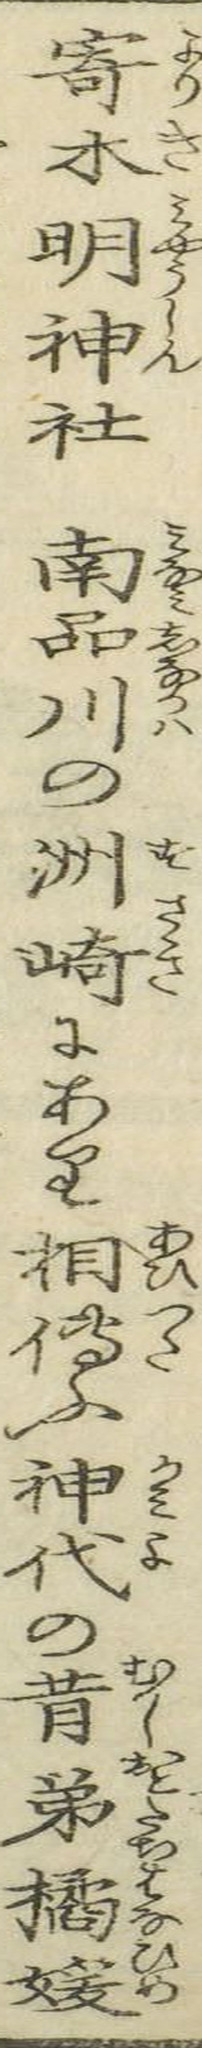寄木明神社南品川の洲崎にあり相傳ふ神代の昔弟橘媛
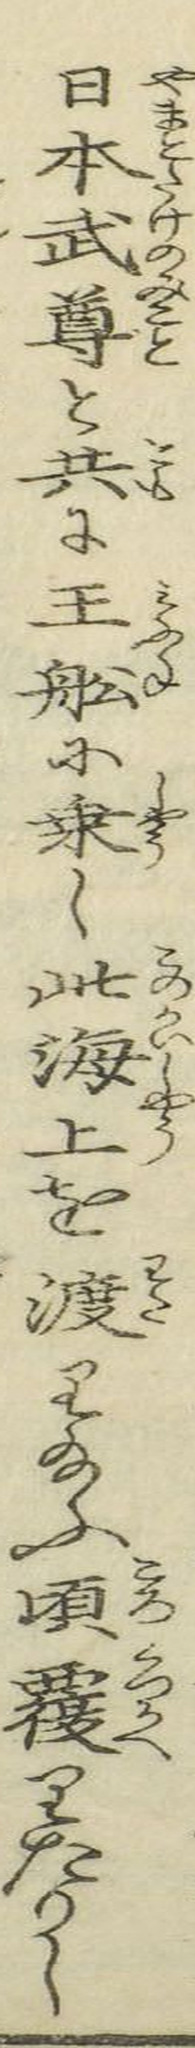日本武尊と共に王舩に乗し此海上を渡り給ふ頃覆りたりし
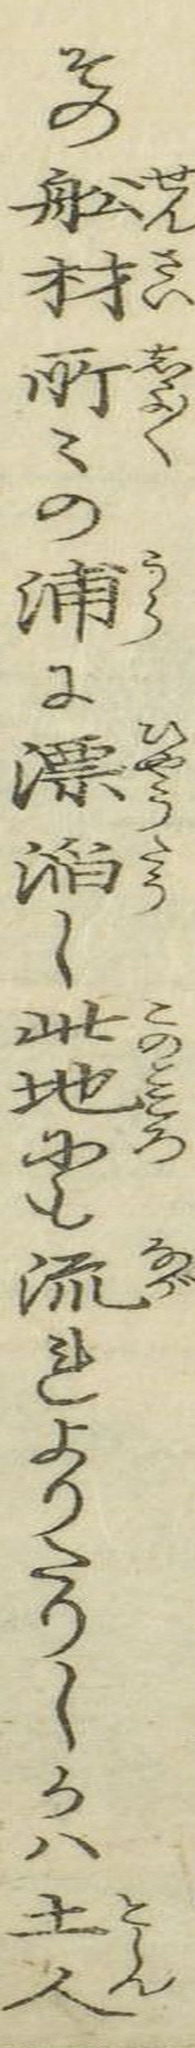その舩材所々の浦に漂㴞し此地にも流れよりたりしかは土人
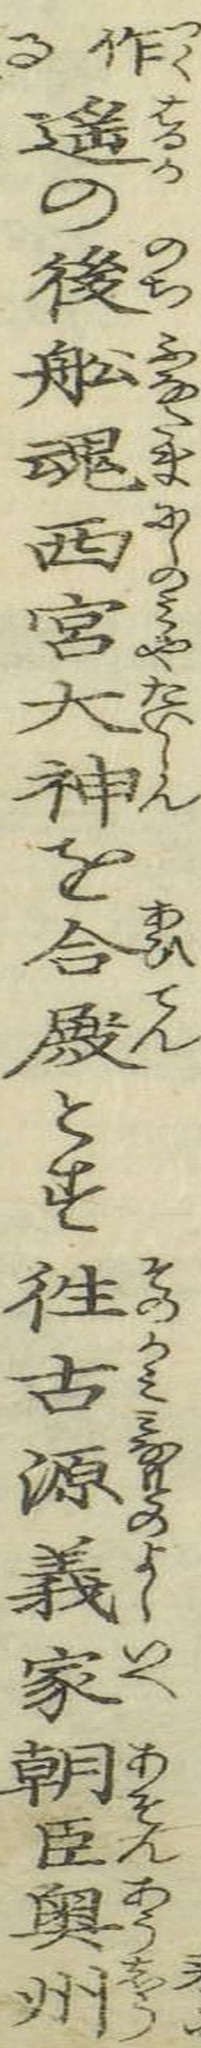作る遥の後舩魂西宮大神を合殿とす往古源義家朝臣奥州
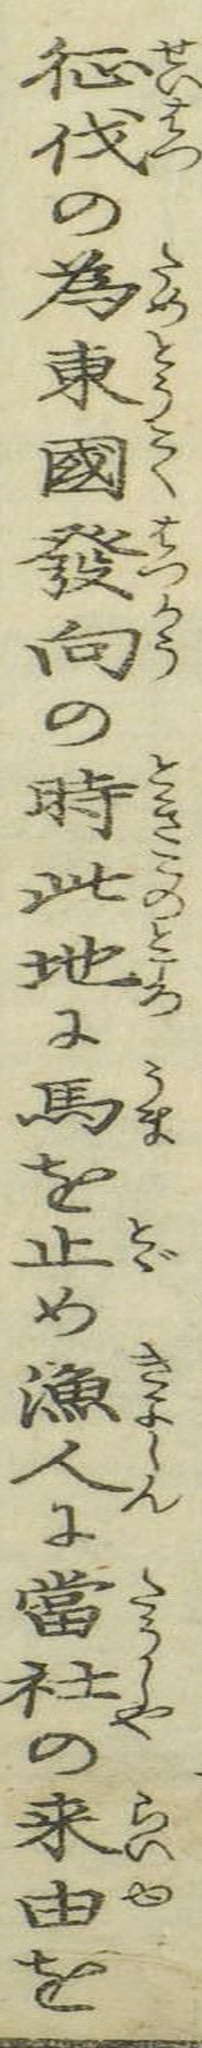征伐の為東國發向の時此地に馬を止め漁人に當社の来由を

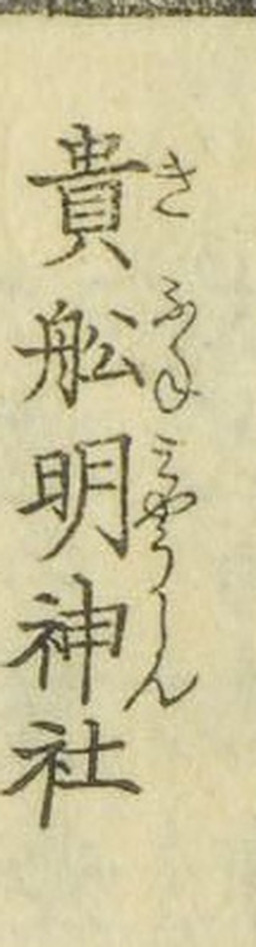貴舩明神社
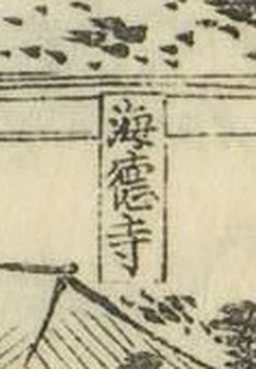海德寺

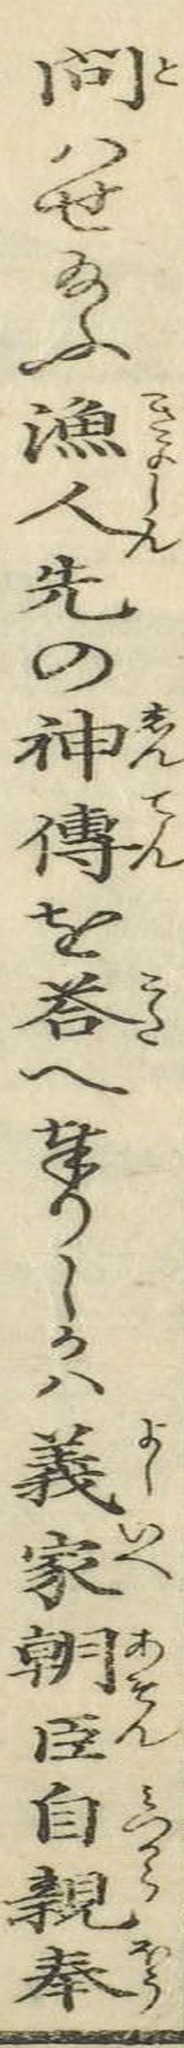問はせ給ふ漁人先の神傳を荅へ奉りしかは義家朝臣自親奉
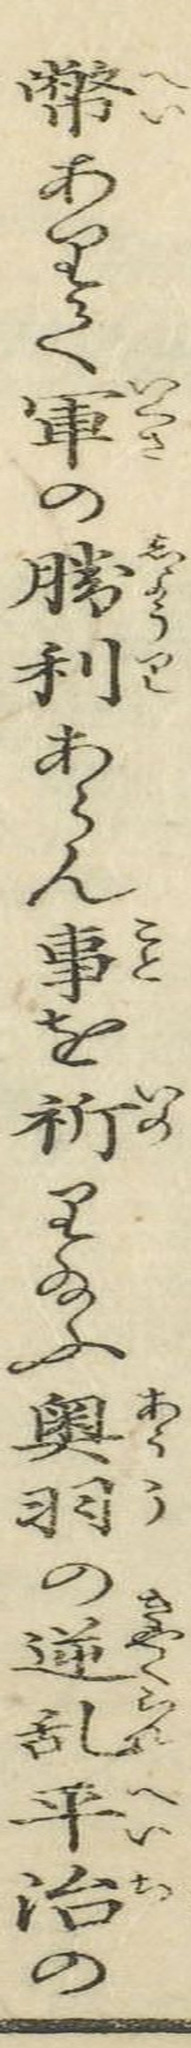幣ありて軍の勝利あらん事を祈り給ふ奥羽の逆乱平治の
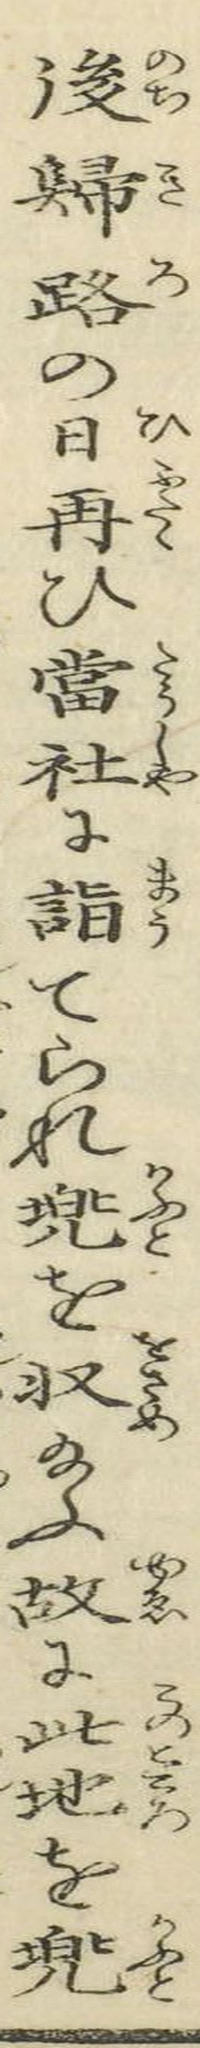後歸路の日再ひ當社に詣てられ兜を収給ふ故に此地を兜
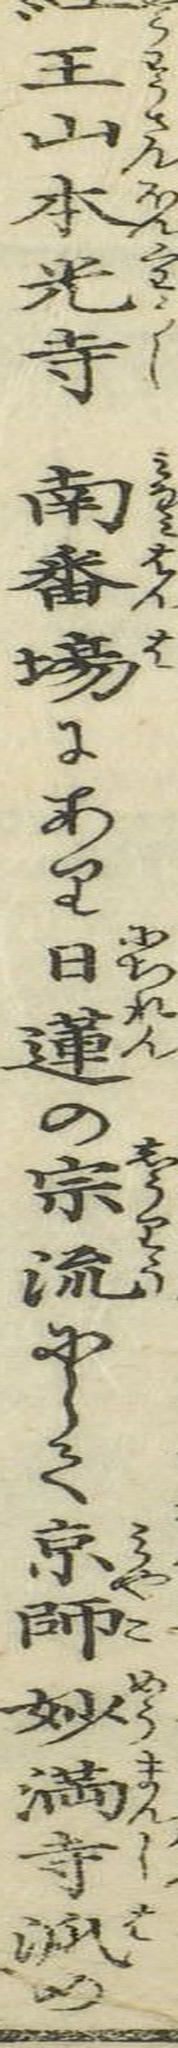経王山本光寺南番塲にあり日蓮の宗流にして京師妙満寺派の
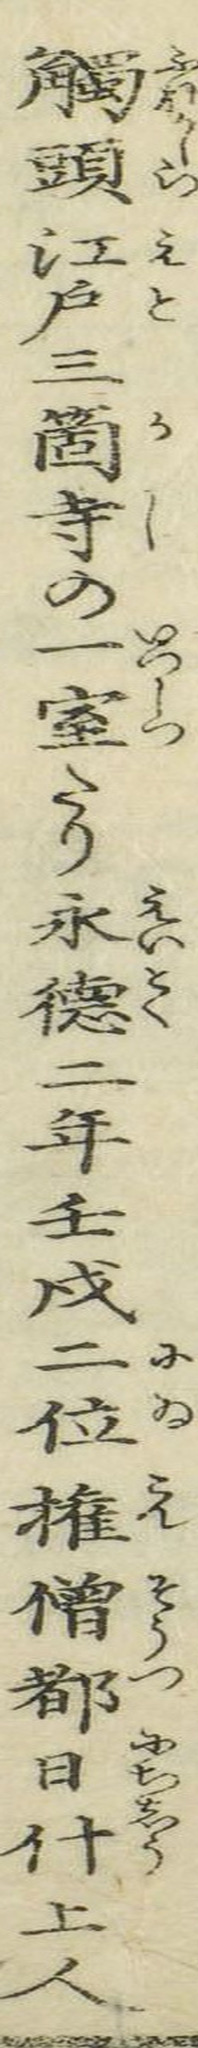觸頭江戸三箇寺の一室たり永徳二年壬戌二位権僧都日什上人
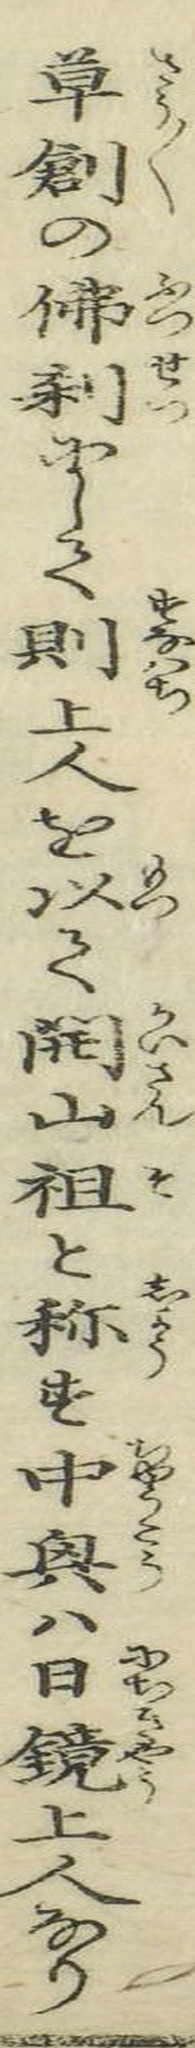草創の佛刹にして則上人を以て開山祖と称す中興は日鏡上人なり
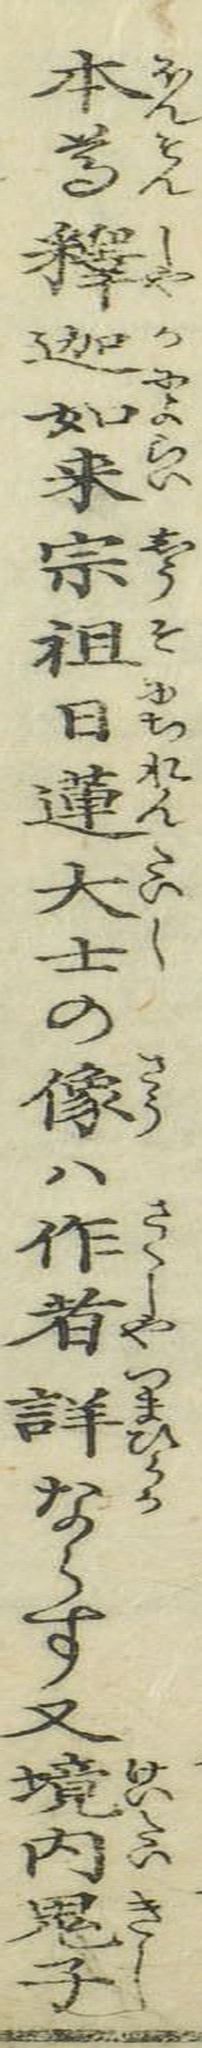本尊釋迦如来宗祖日蓮大士の像は作者詳ならす又境内鬼子
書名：江戸名所図会 20巻 巻之4
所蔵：東京学芸大学教育コンテンツアーカイブ
